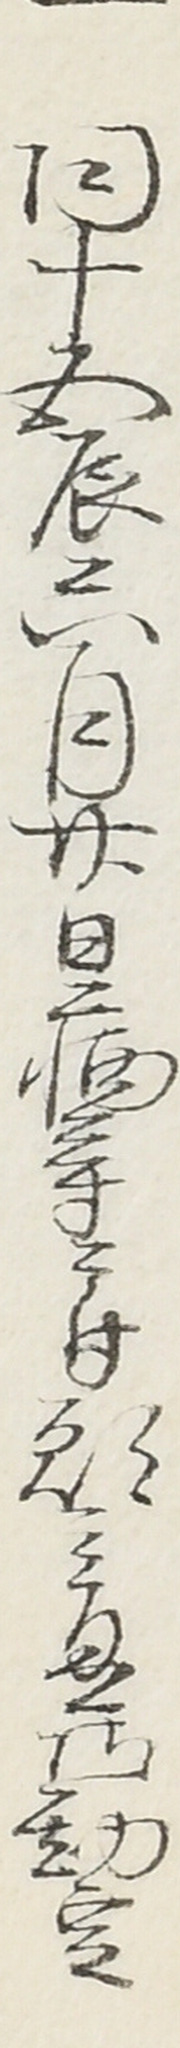一同十五辰六月廿日病気ニ付願之通御勘定
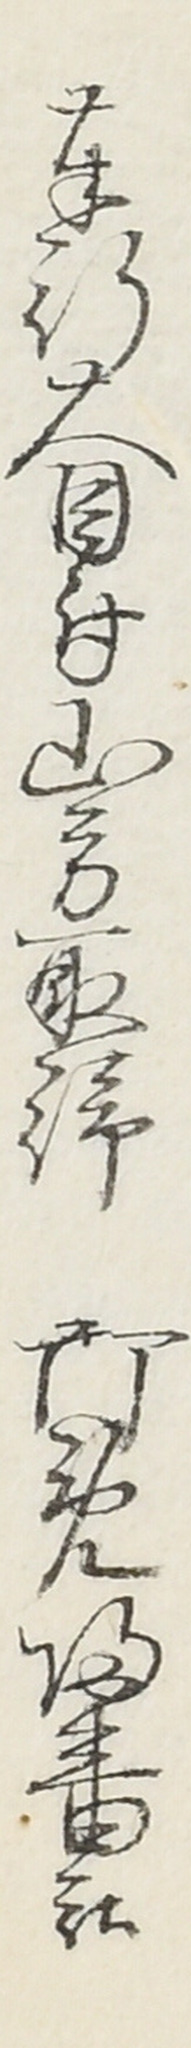奉行大目付山方取締御免帰番被
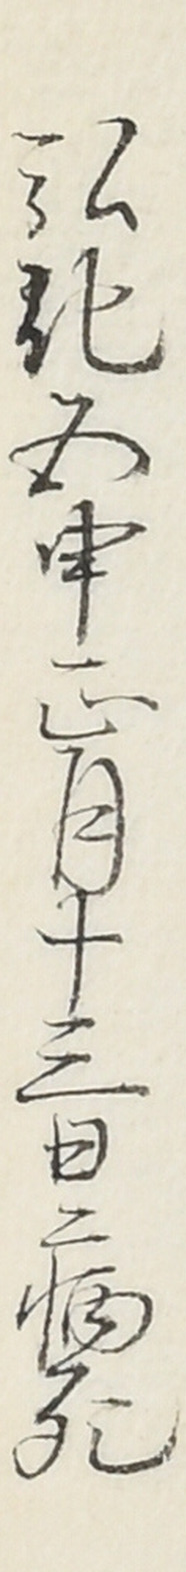一弘化五申正月十三日病死

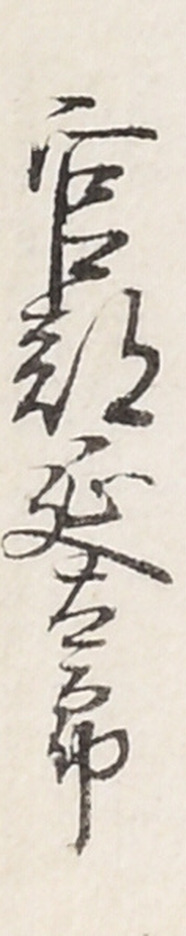宮部延太郎
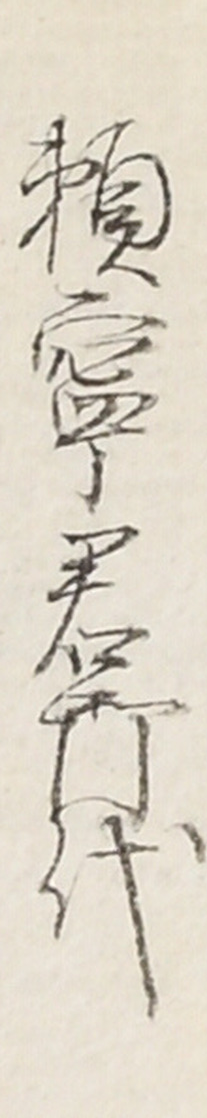頼寧君御代
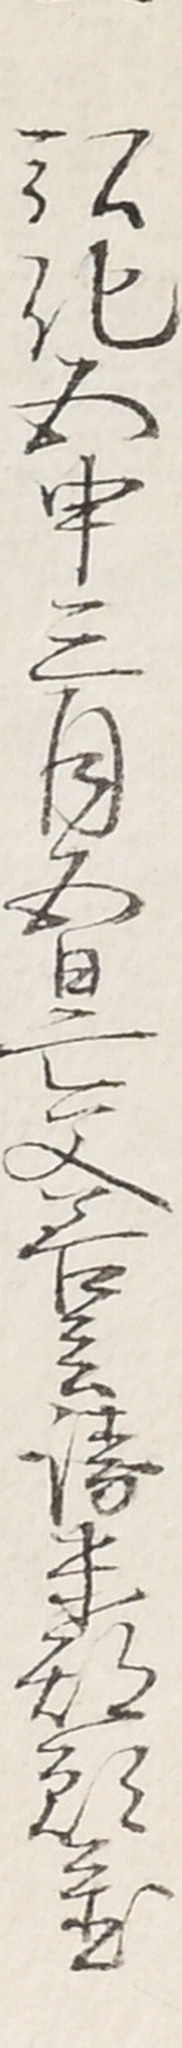一弘化五申三月五日亡父善兵衛末期願置
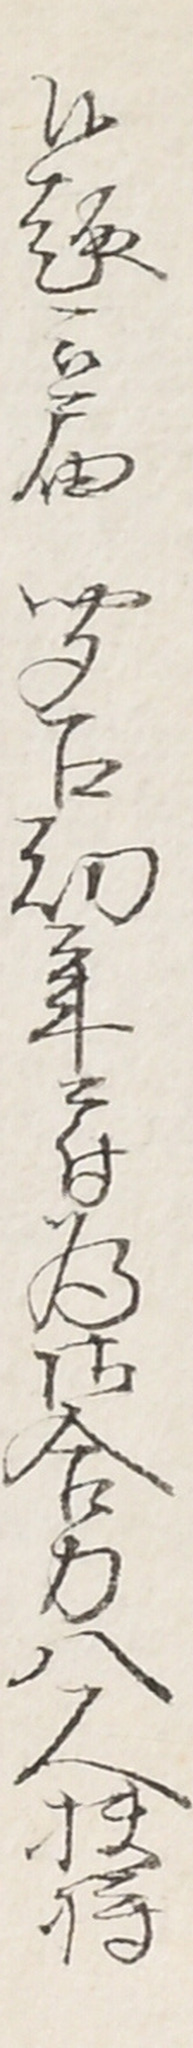候趣被届聞召幼年ニ付為御合力八人扶持
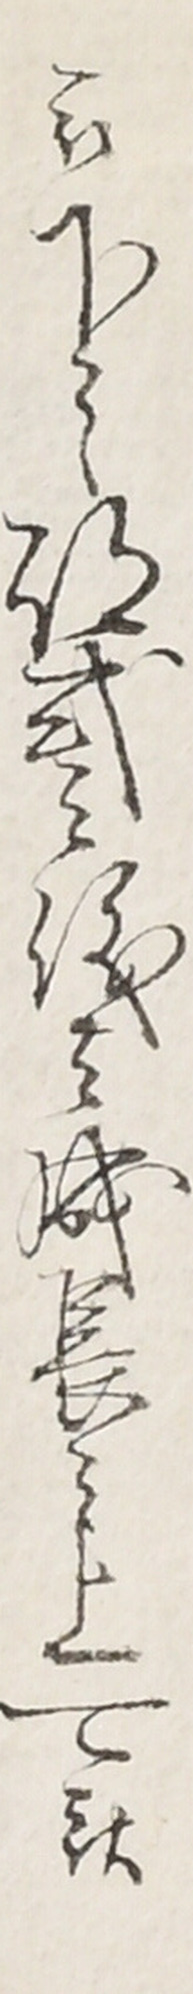被下之跡式之儀は成長之上可被
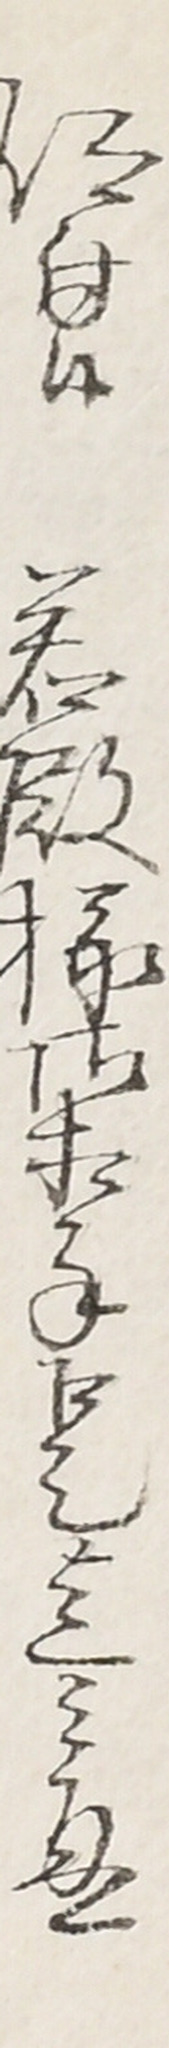仰付候若殿様御相手是迄之通
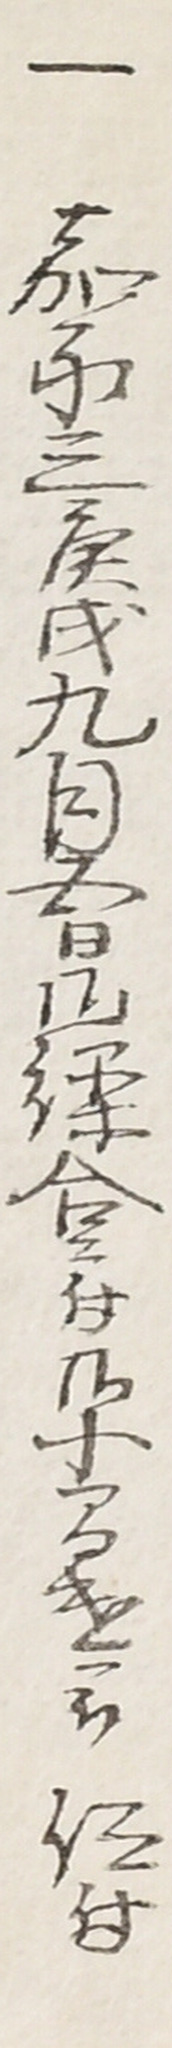一嘉永三庚戌九月五日御繰合ニ付御小間遣被仰付
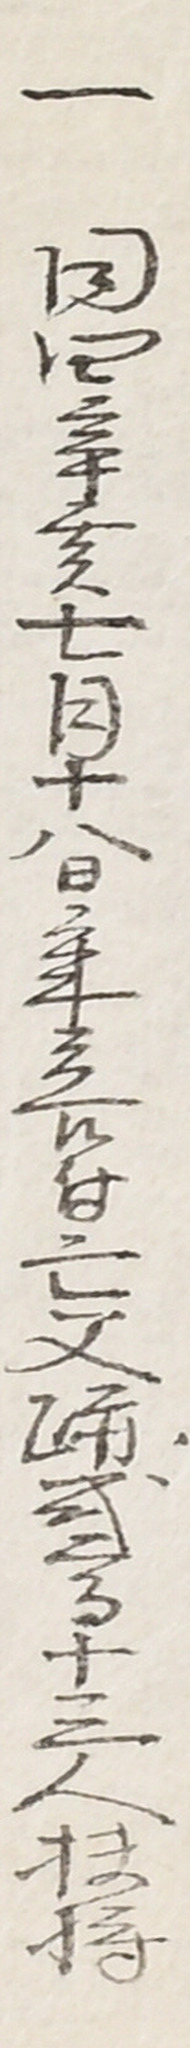一同四辛亥七月十八日年立候付亡父跡式高十三人扶持
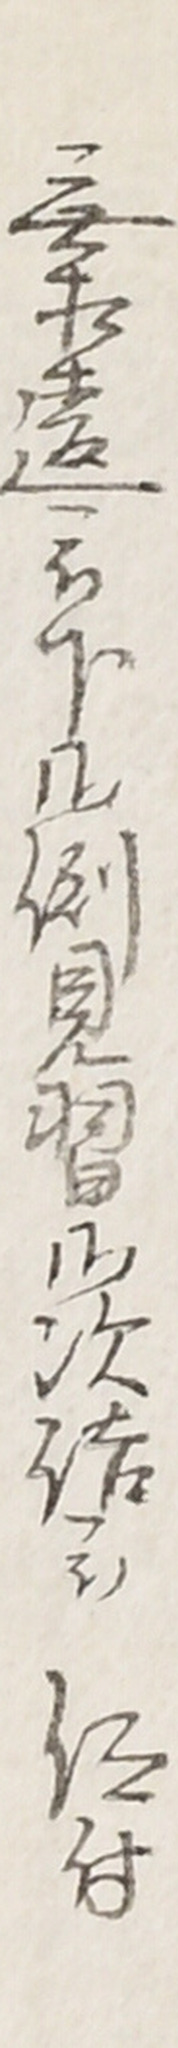無相違被下御側見習御次詰被仰付
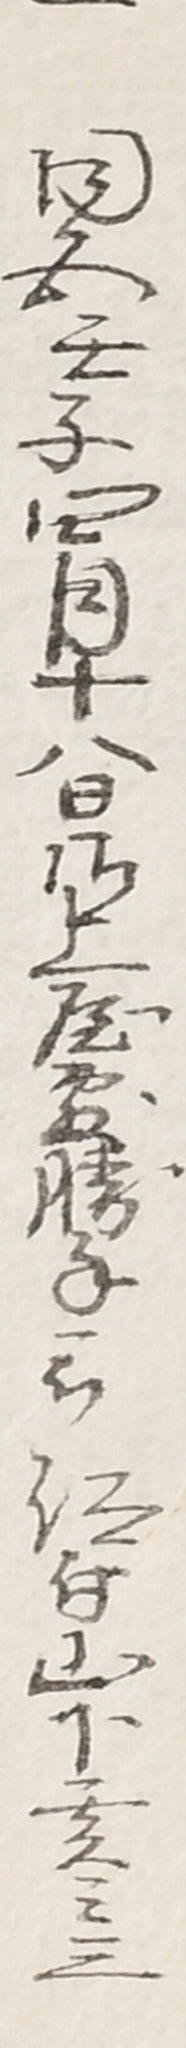一同五壬子四月十八日御上屋敷勝手被仰付山下亥之三
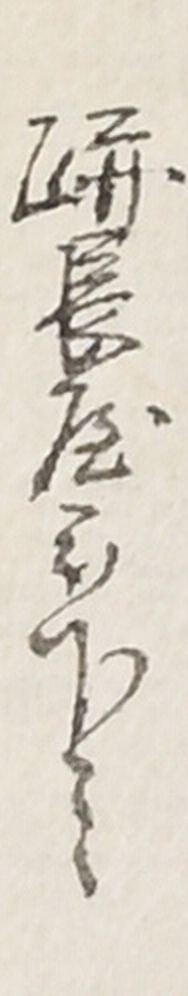跡長屋被下之
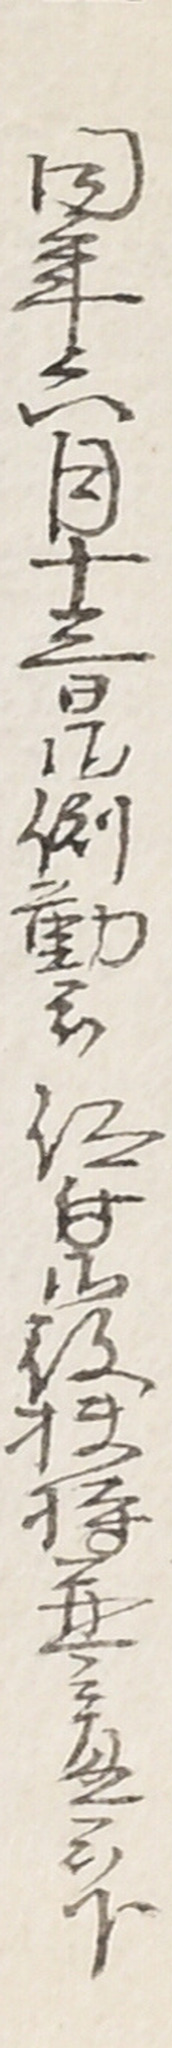一同年六月十三日御側勤被仰付御役扶持並之通被下
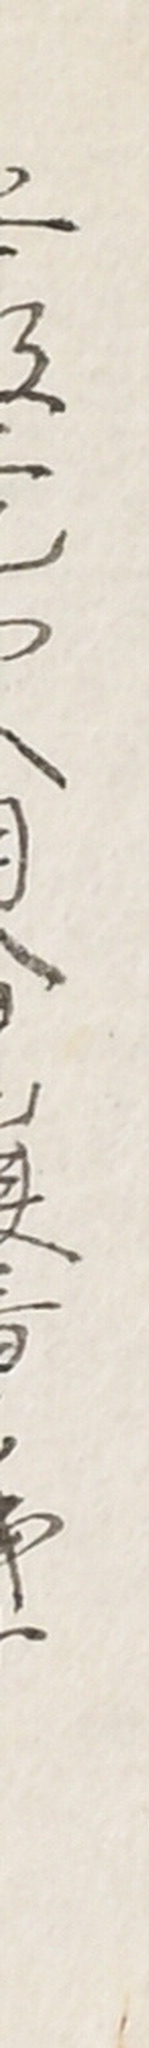一安政二乙卯八月八日御使番被成下
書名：給人諸士勤仕録（七）
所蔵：伊那市立高遠町図書館・合同会社AMANE
